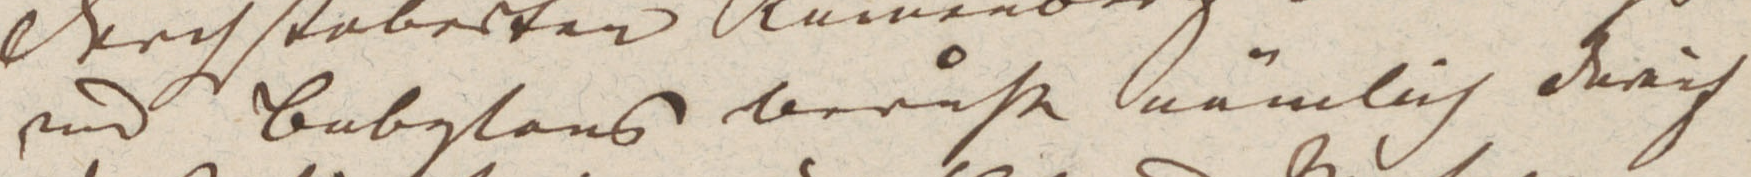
und Babylons beruht nämlich darauf
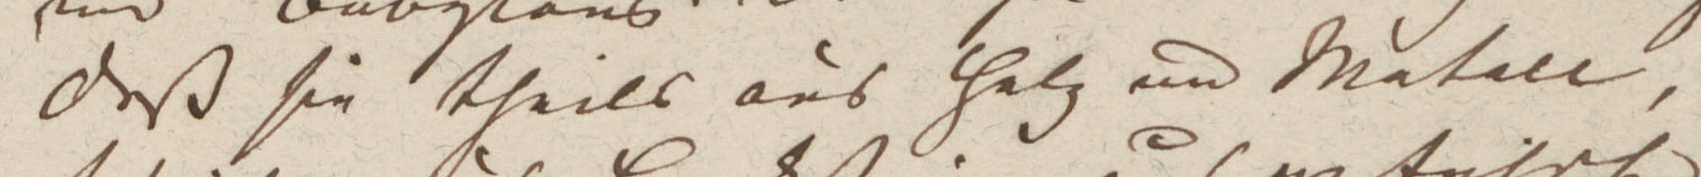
dass sie theils aus Holz und Metall,
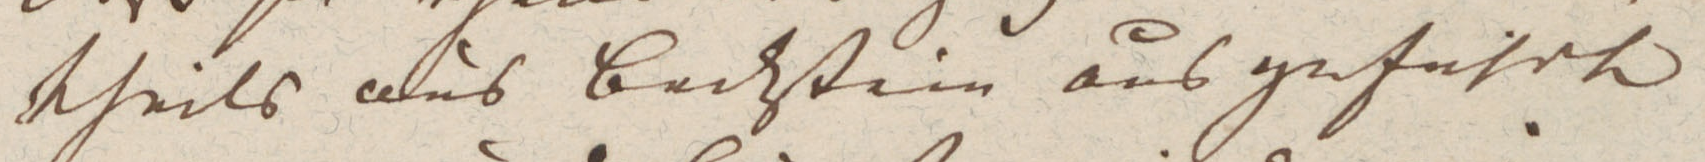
theils aus Backstein ausgeführt
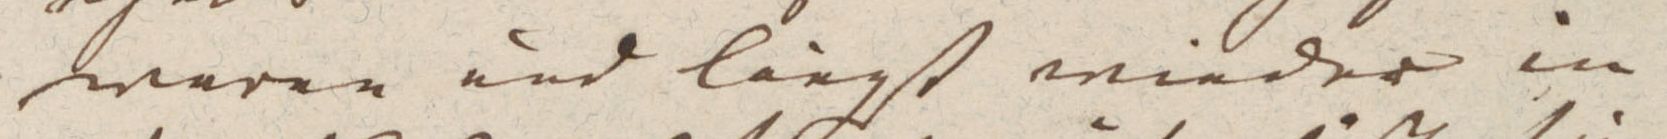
waren und längst wieder in
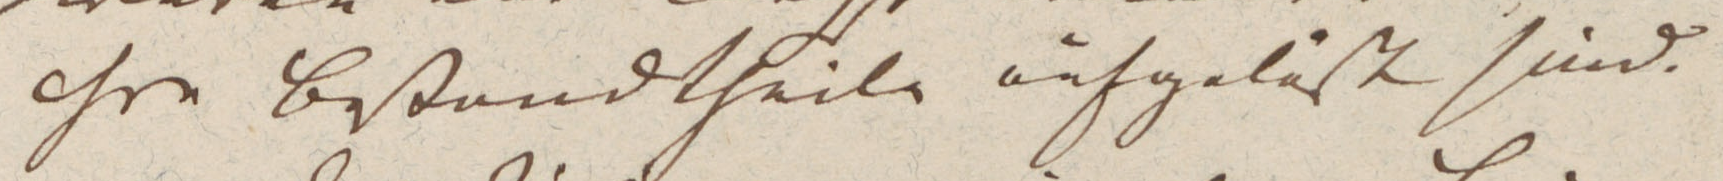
ihre Bestandtheile aufgelöst sind.
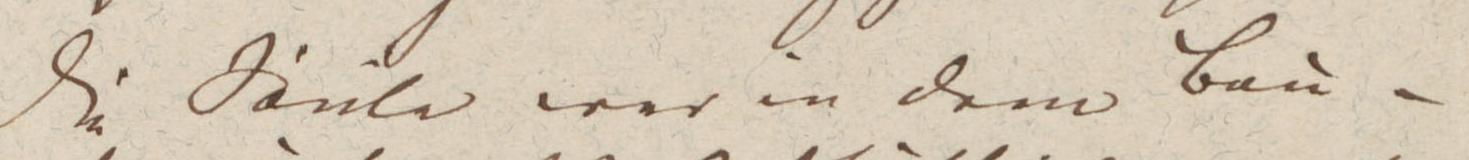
Die Säule war in dem Bau-
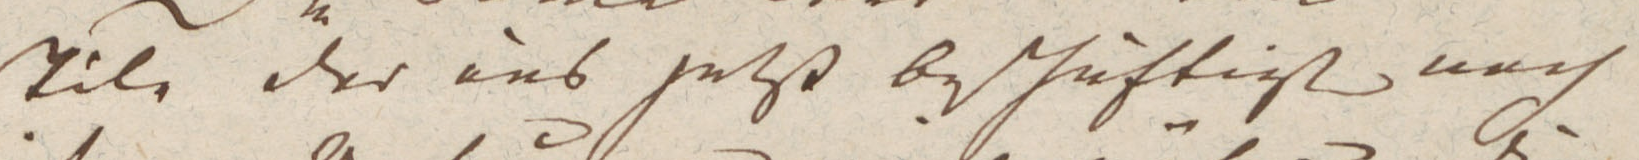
stile der uns jetzt beschäftigt noch
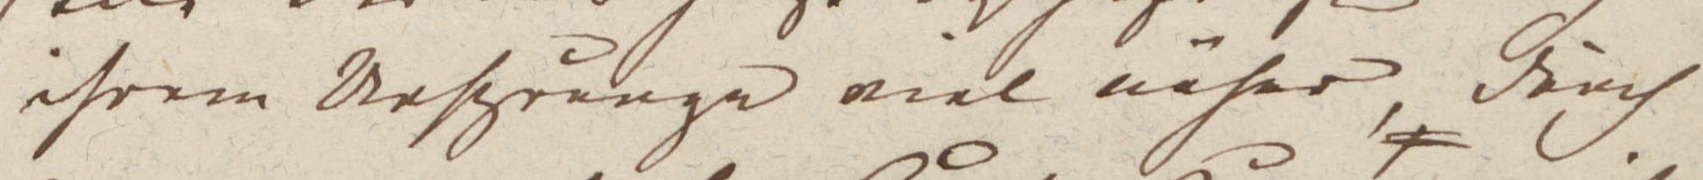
ihrem Ursprunge viel näher, durch
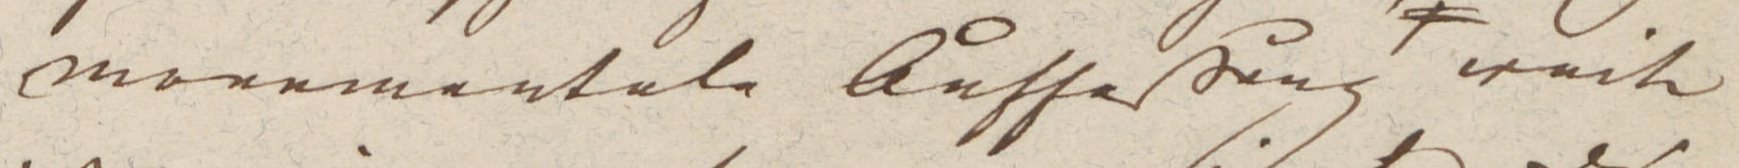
monumentale Auffassung % weit
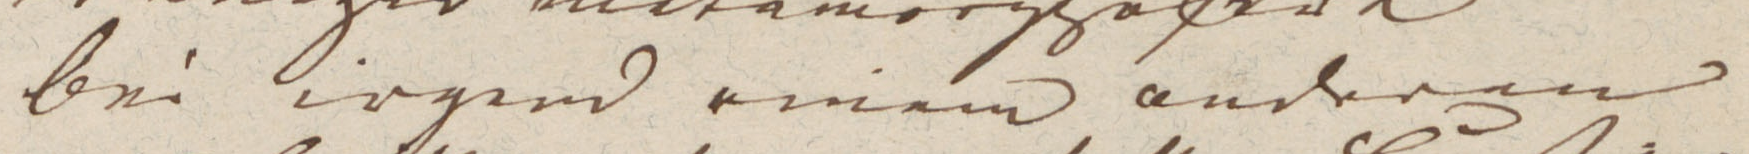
bei irgend einem anderen
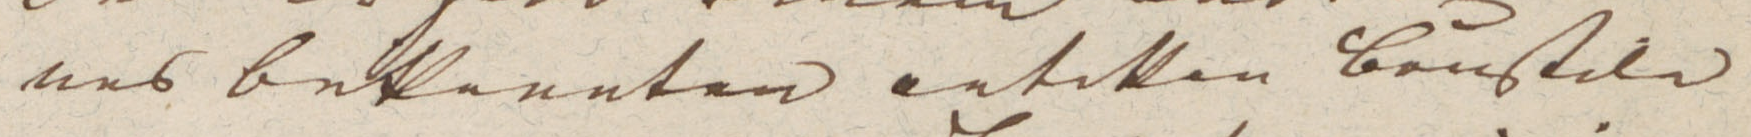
uns bekannten antiken Baustile
